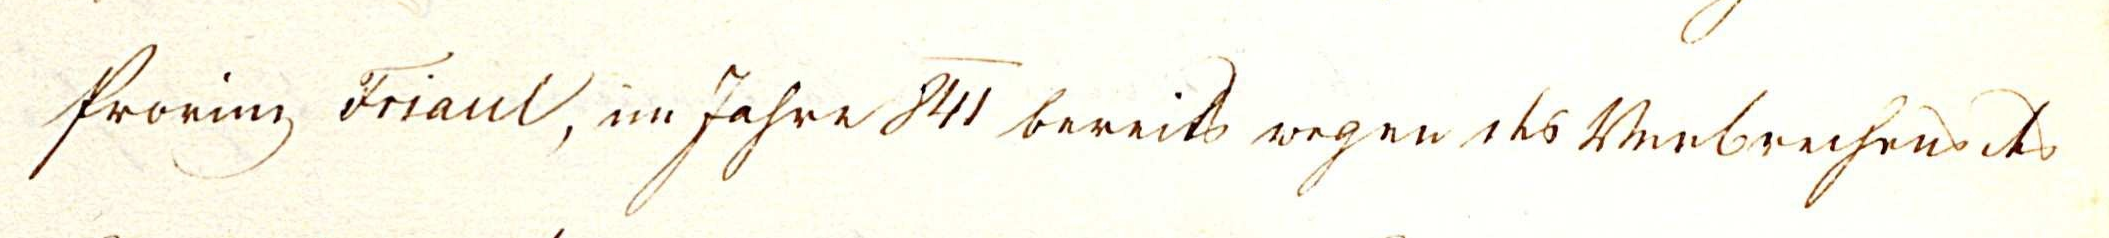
Provinz Friaul, im Jahre 841 bereits wegen des Verbrechens des
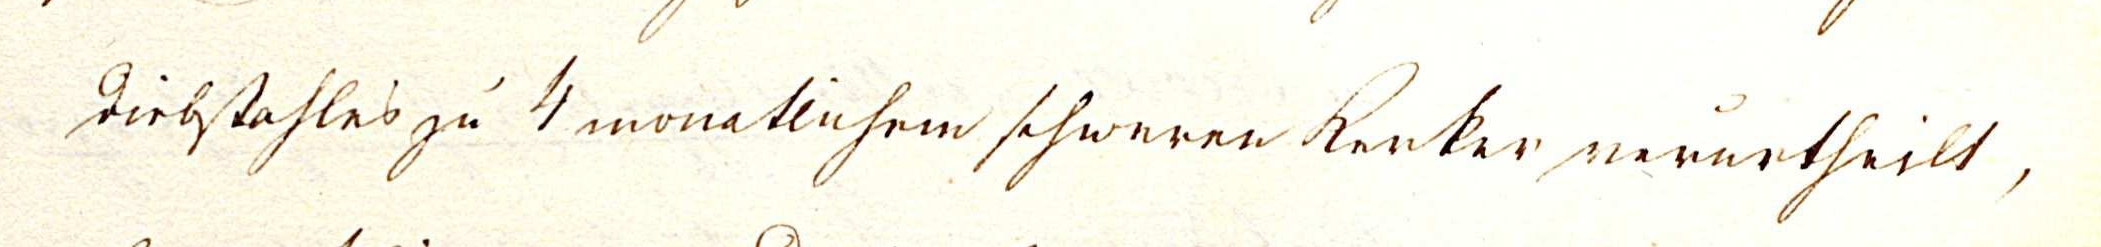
Diebstahles zu 4 monatlichem schweren Kerker verurtheilt,
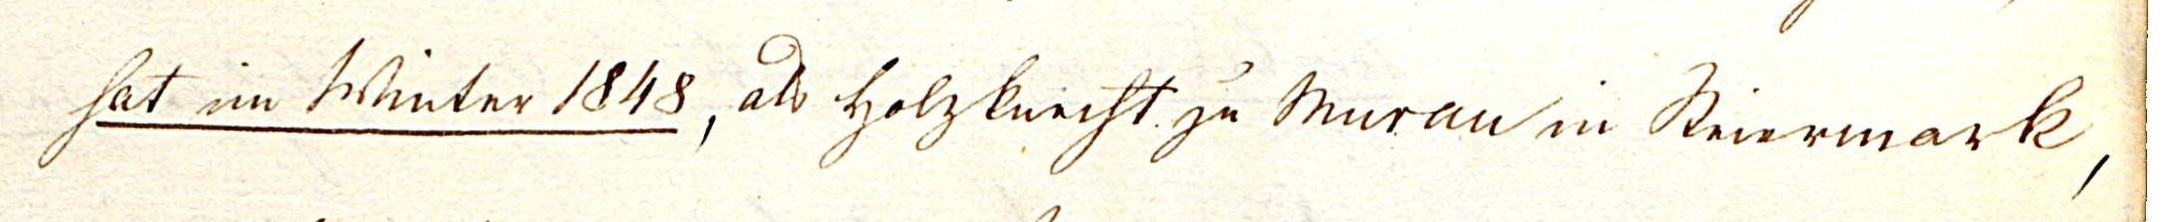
hat im Winter 1848, als Holzknecht zu Murau in Steiermark,
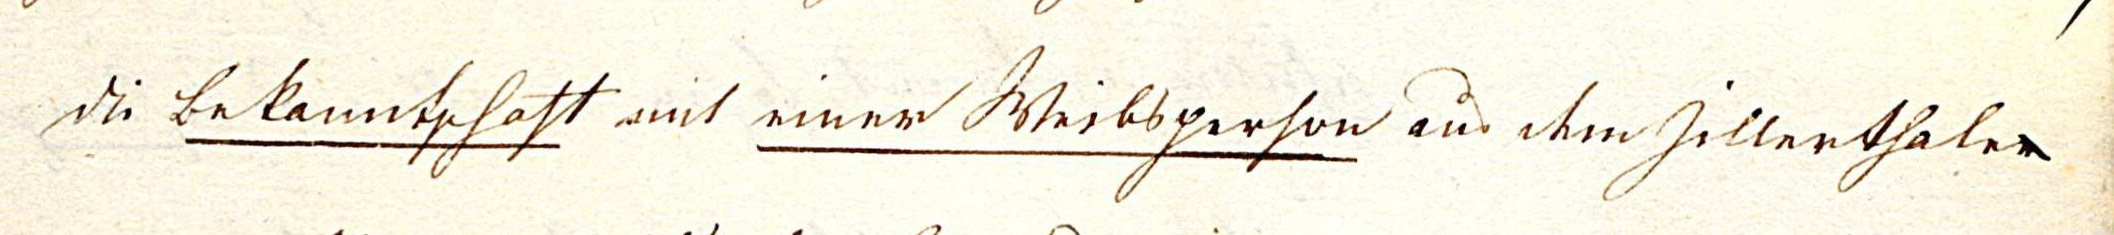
die Bekanntschaft mit einer Weibsperson aus dem Zillerthaler
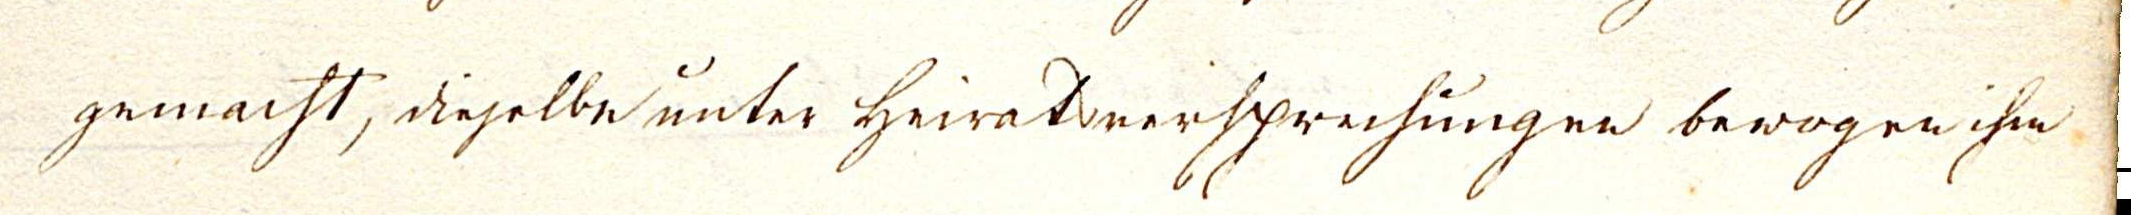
gemacht, dieselbe unter Heiratsversprechungen bewogen ihm
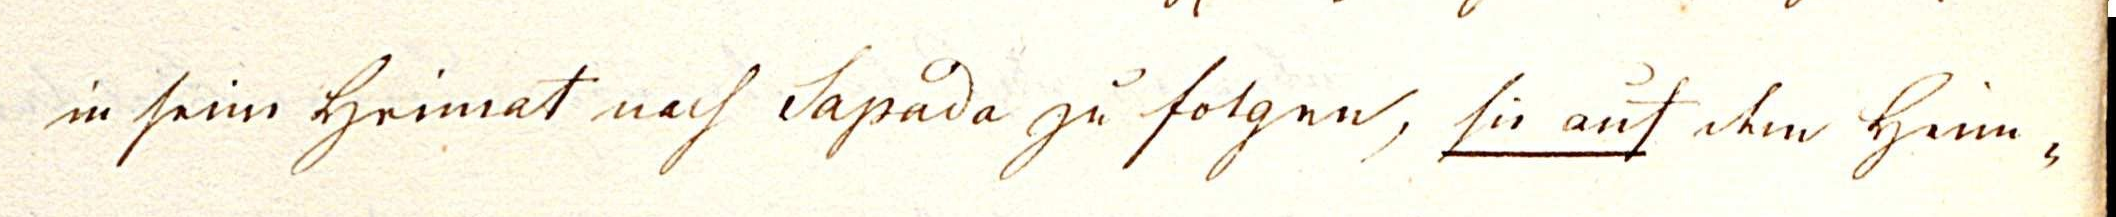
in seine Heimat nach Sapada zu folgen, sie auf dem Heim¬
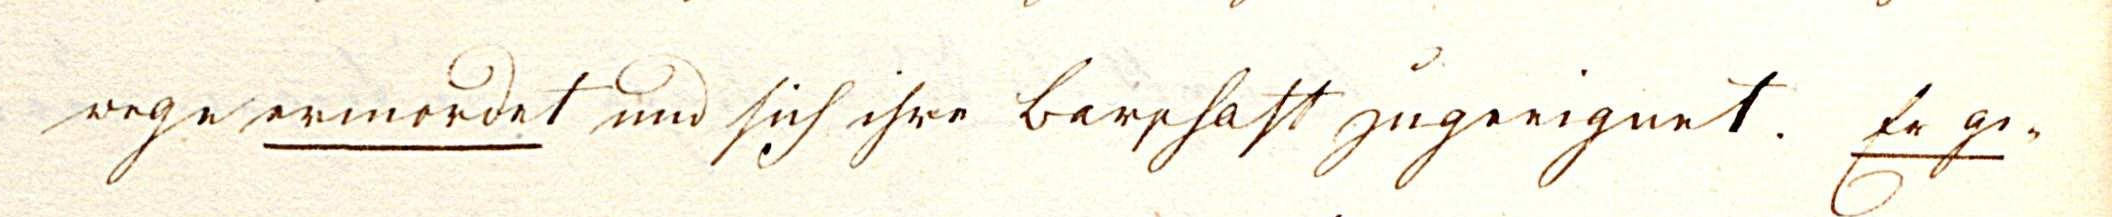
wege ermordet und sich ihre Barschaft zugeeignet. Er ge¬
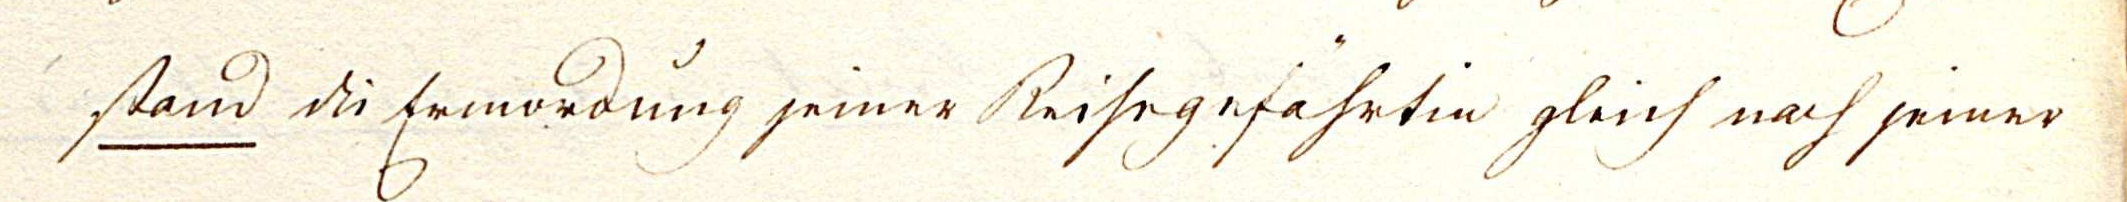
stand die Ermordung seiner Reisegefährtin gleich nach seiner
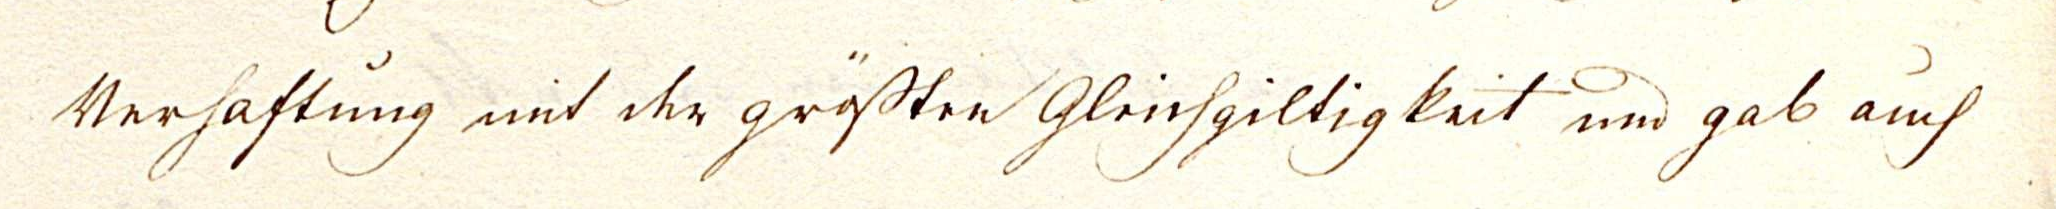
Verhaftung mit der größten Gleichgiltigkeit und gab auch
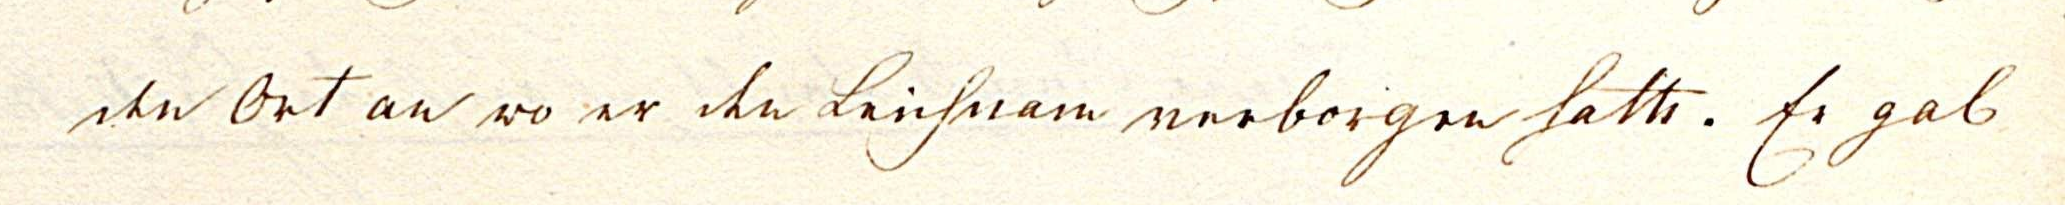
den Ort an wo er den Leichnam verborgen hatte. Er gab
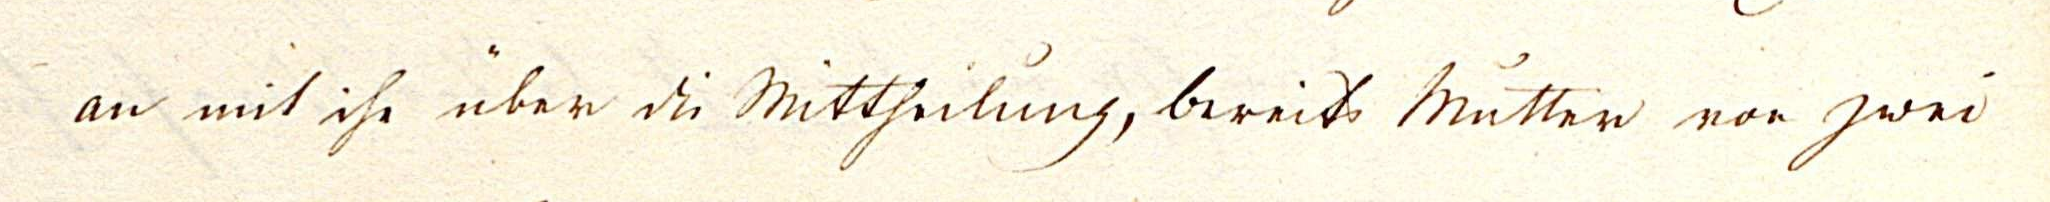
an mit ihr über die Mittheilung, bereits Mutter von zwei
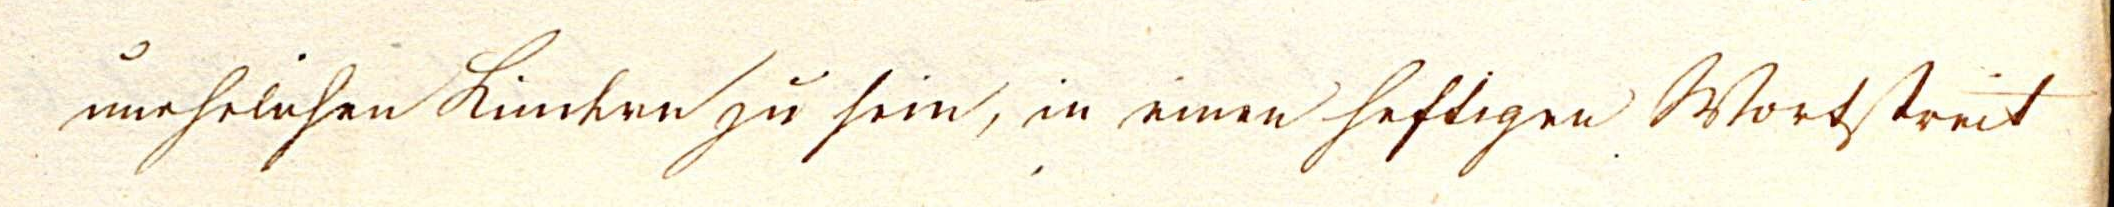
unehelichen Lxx zu sein, in einen heftigen Wortstreit
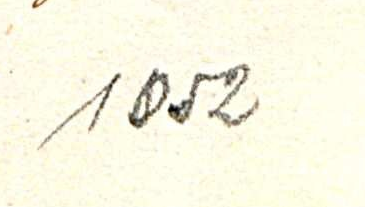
1052
